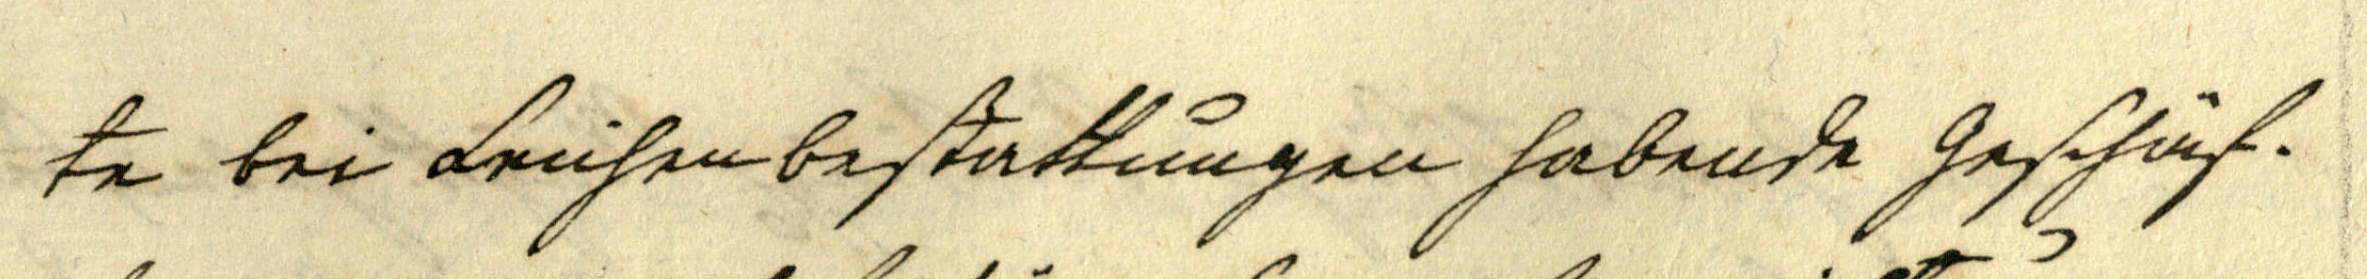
te bei Leichenbestattungen habende Geschäf¬
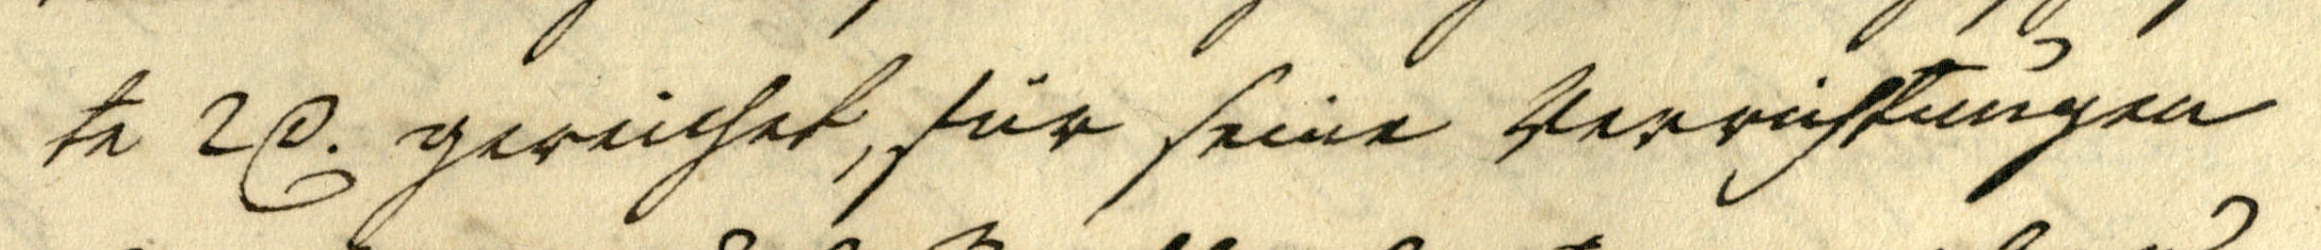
te 2 l. gereichet, für seine Verrichtungen
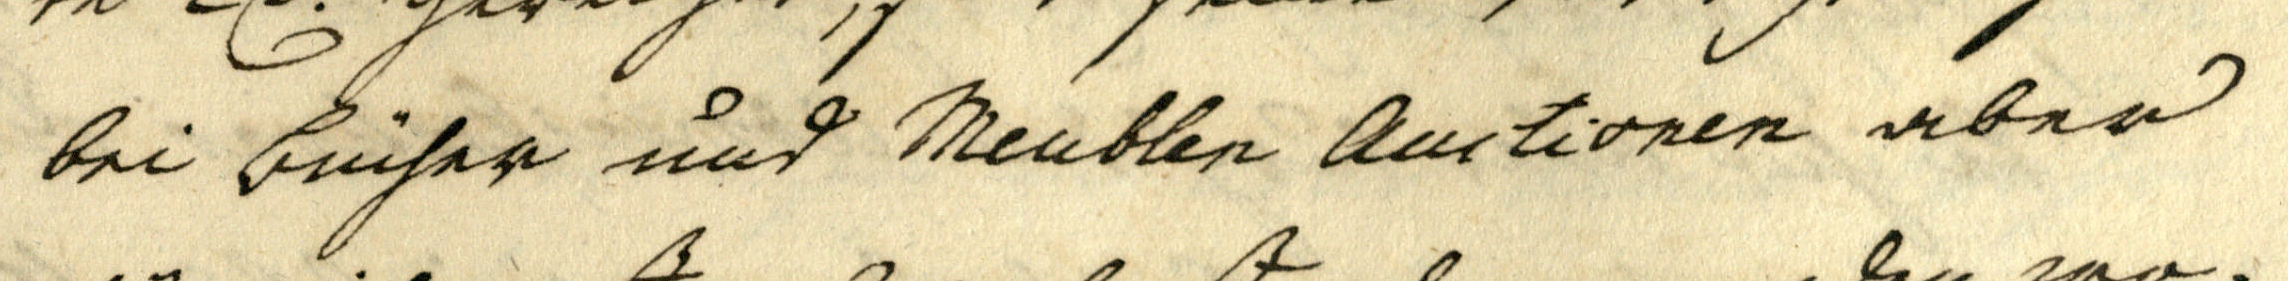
bei Bücher und Meublen Auctionen aber
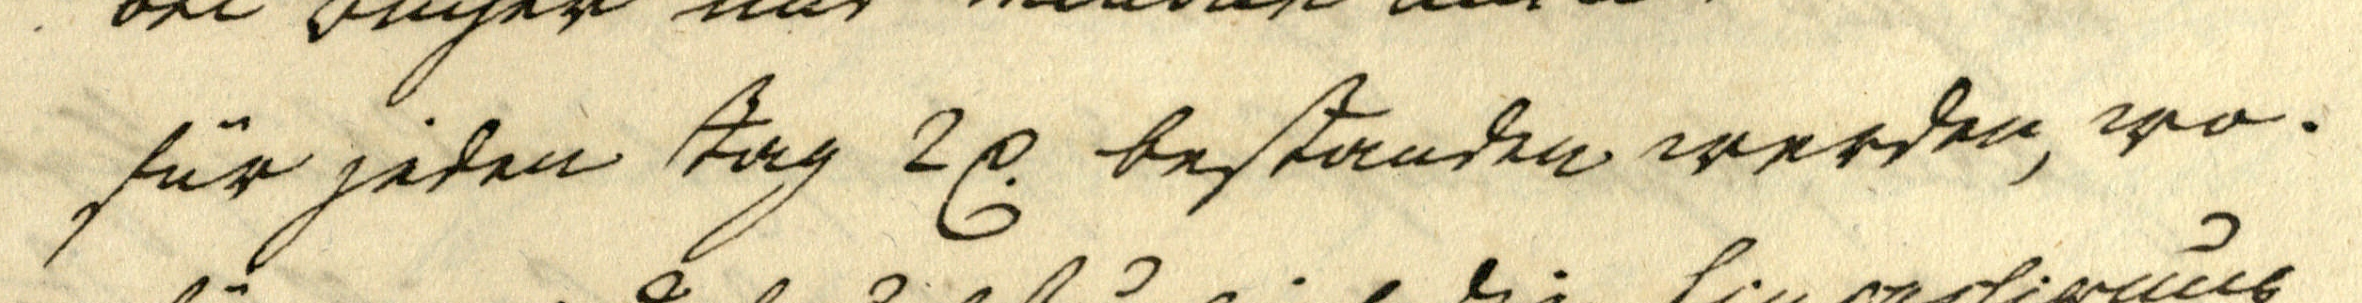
für jeden Tag 2 l. bestanden werden, wo¬
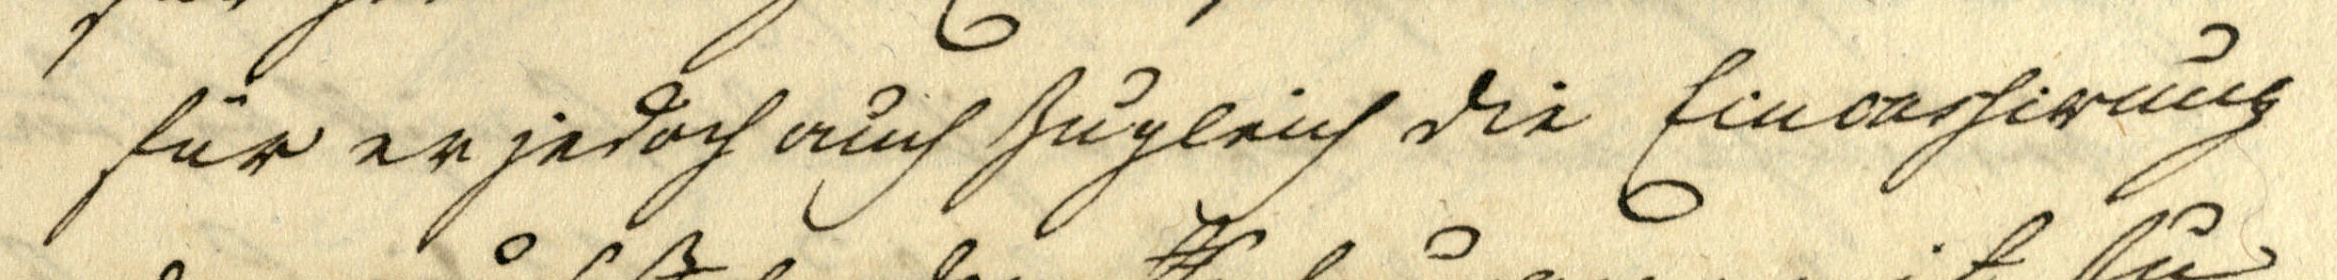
für er jedoch auch zugleich die Eincassirung
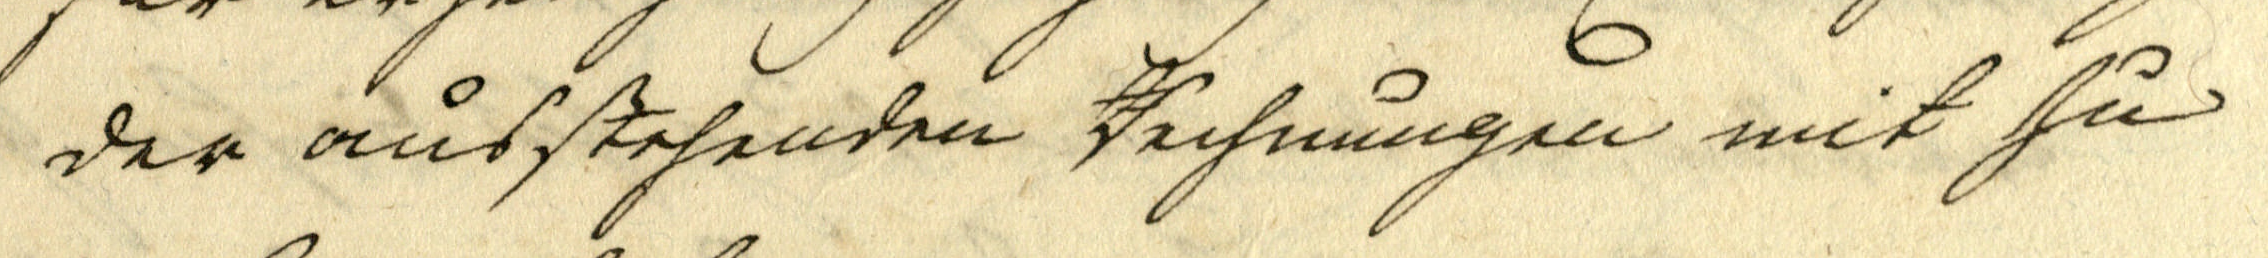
der ausstehenden Rechnungen mit zu
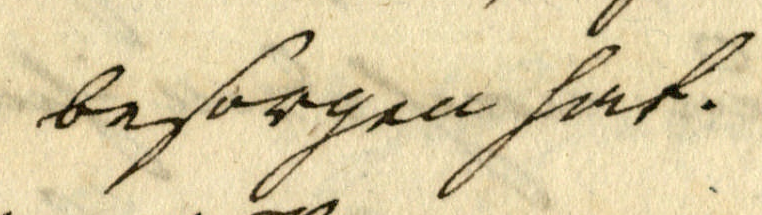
besorgen hat.
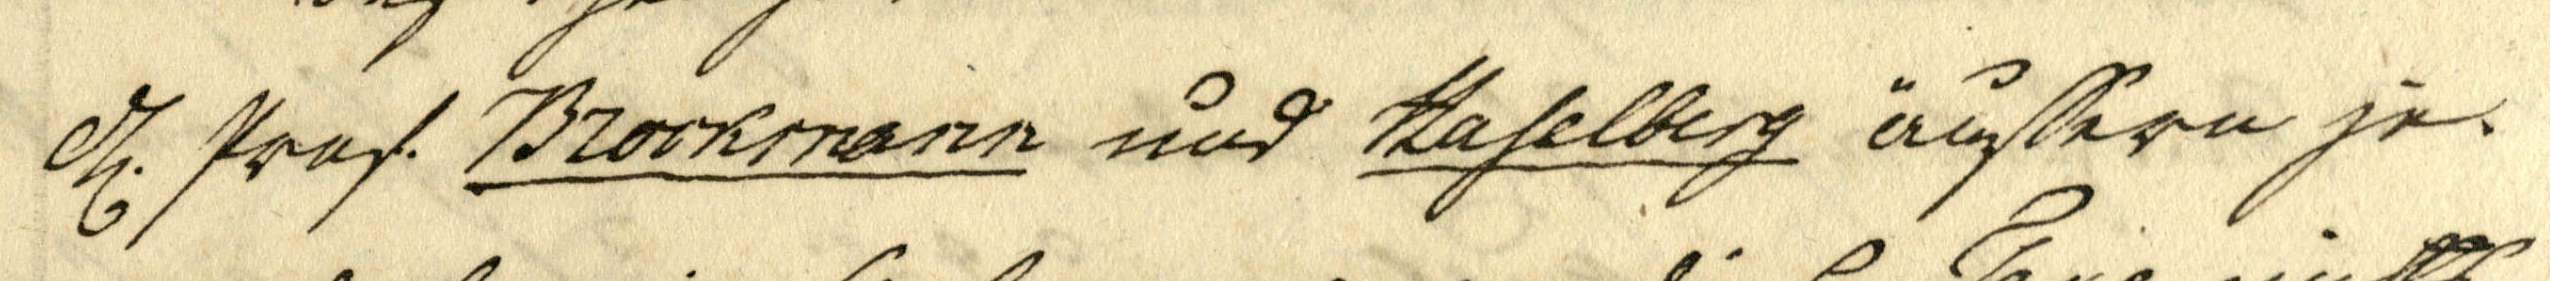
dh. Prof. Brockmann und Haselberg äussern je¬
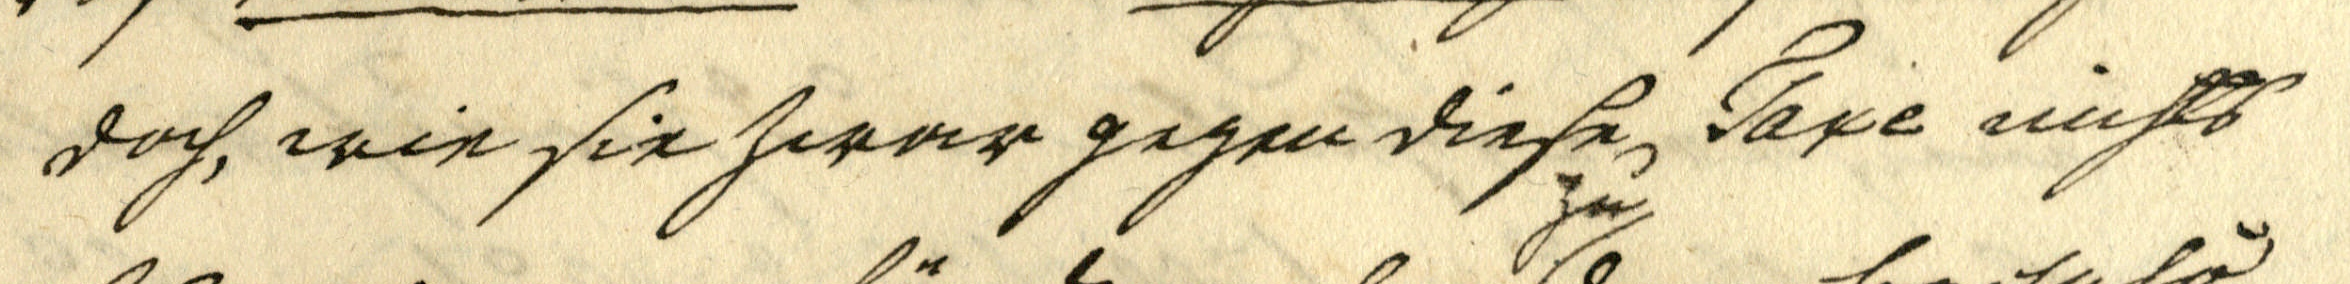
doch, wie sie zwar gegen diese Taxe nichts
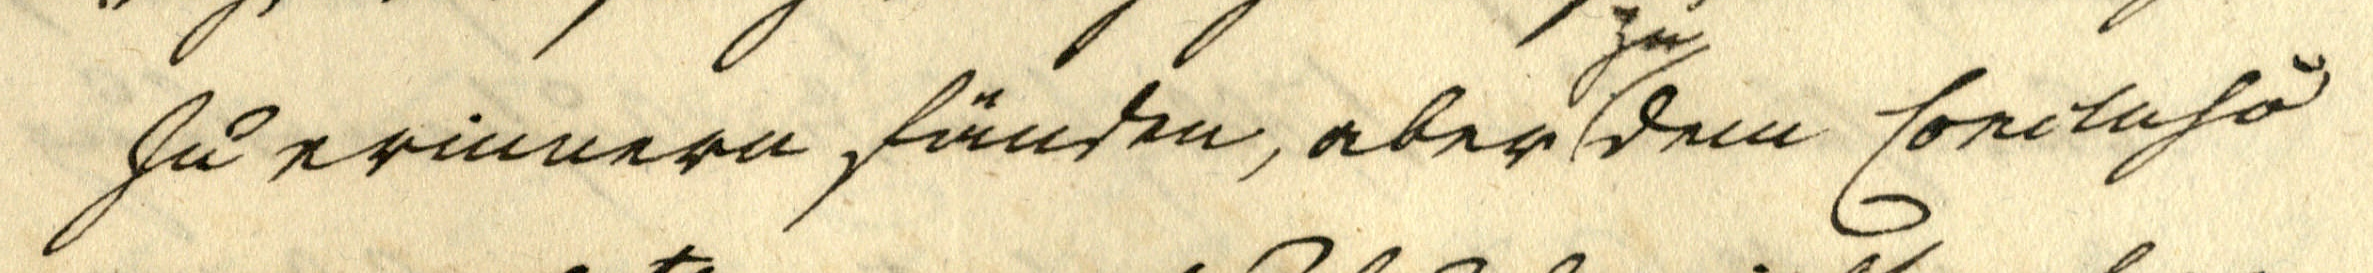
zu erinnern fänden, aber dem Concluso
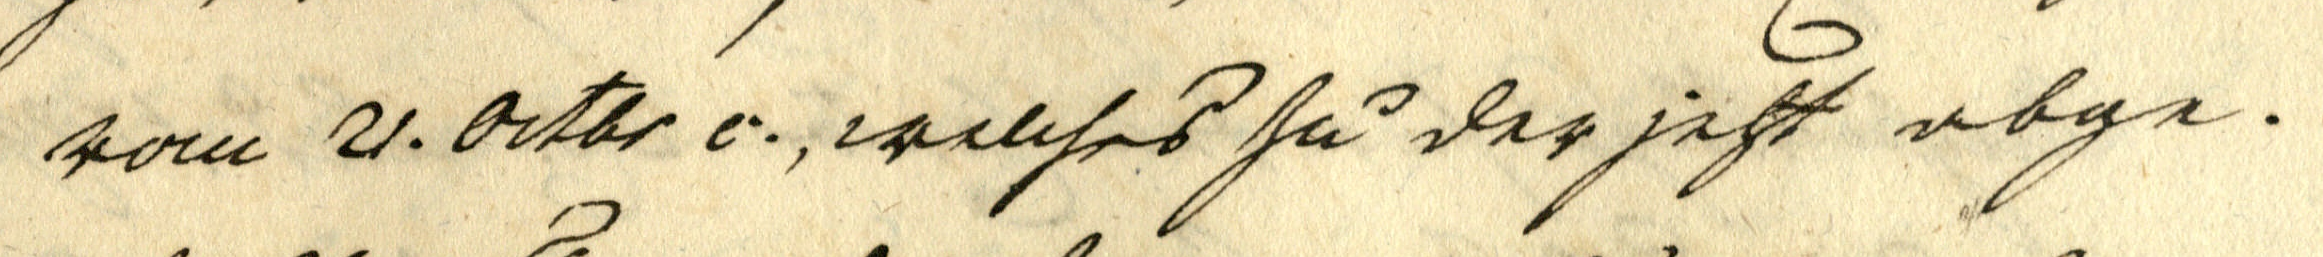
vom 21. Octbr c., welches zu der jetzt abge¬
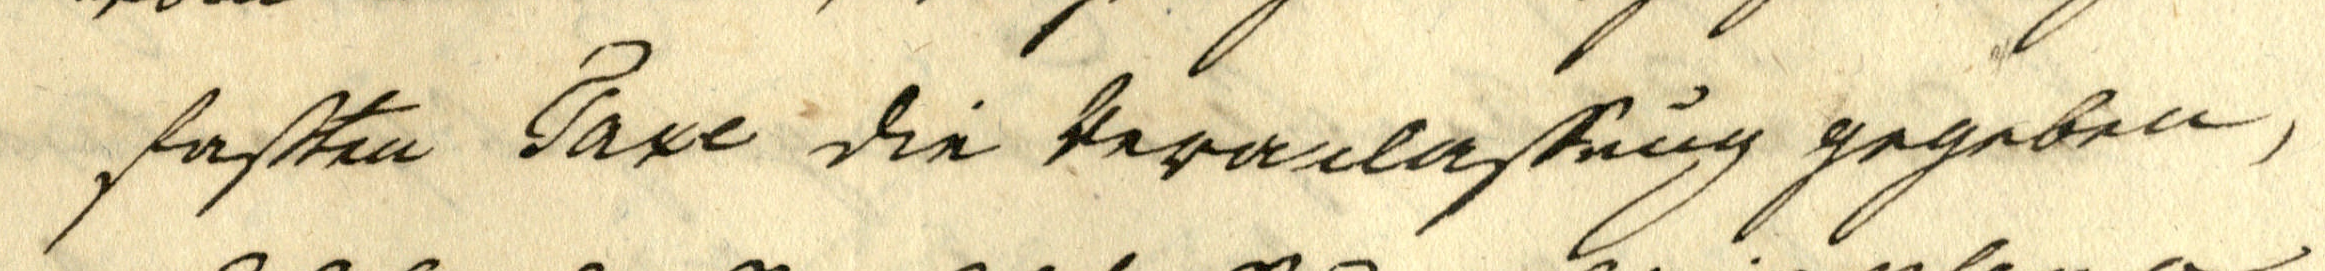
faßten Taxe die Veranlassung gegeben,
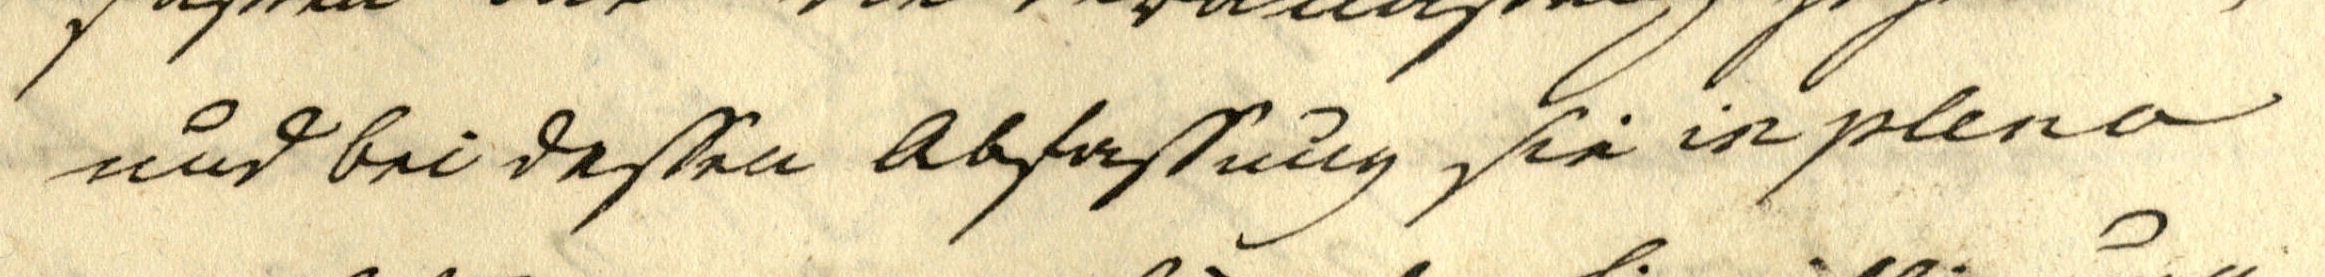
und bei dessen Abfassung sie in pleno
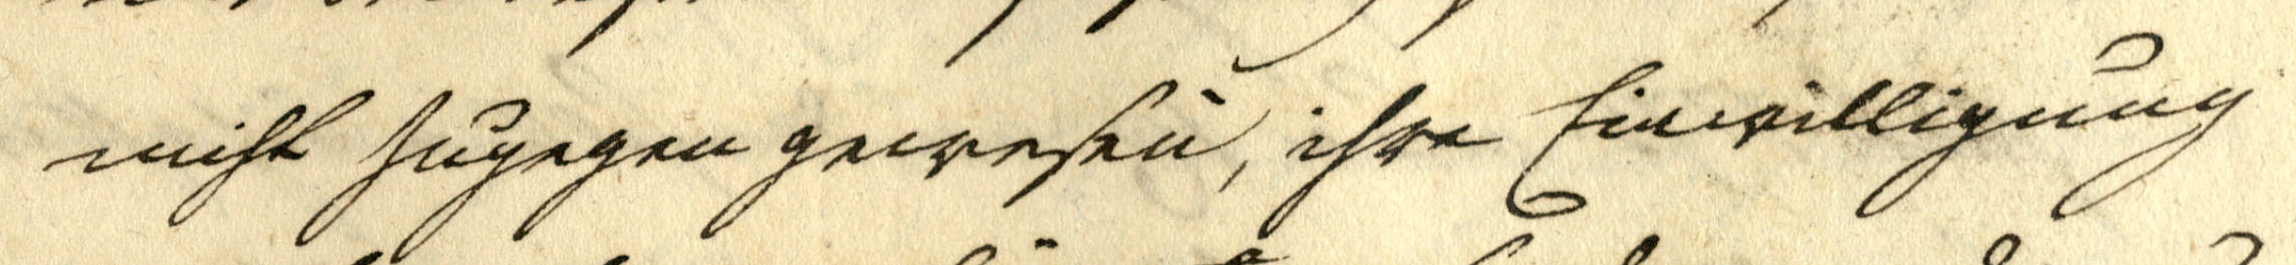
nicht zugegen gewesen, ihre Einwilligung
